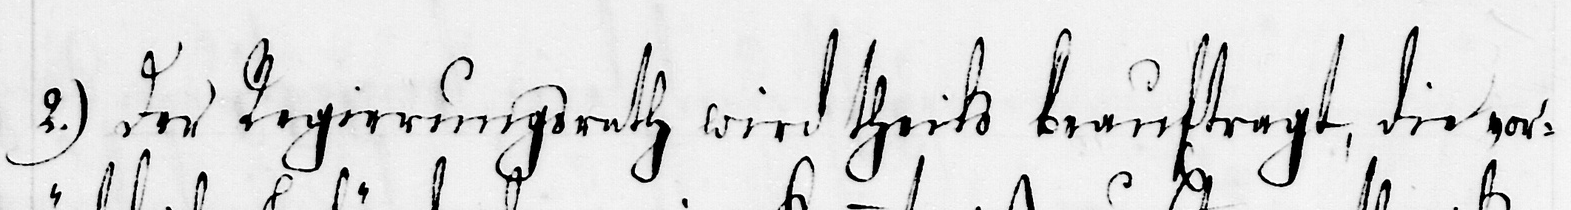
2.) Der Regierungsrath wird theils beauftragt, die vor¬
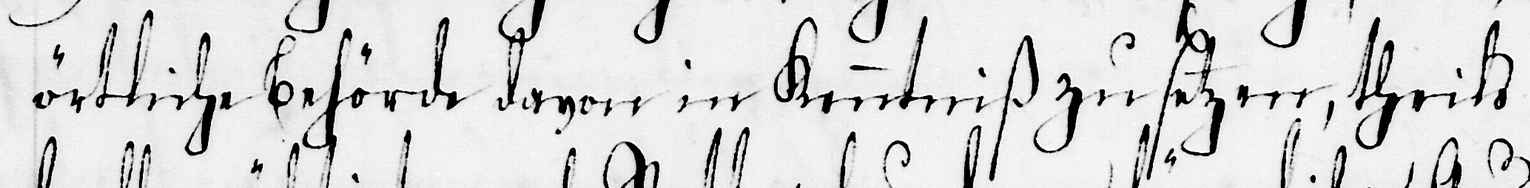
örtliche Behörde davon in Kenntniß zu setzen, theils
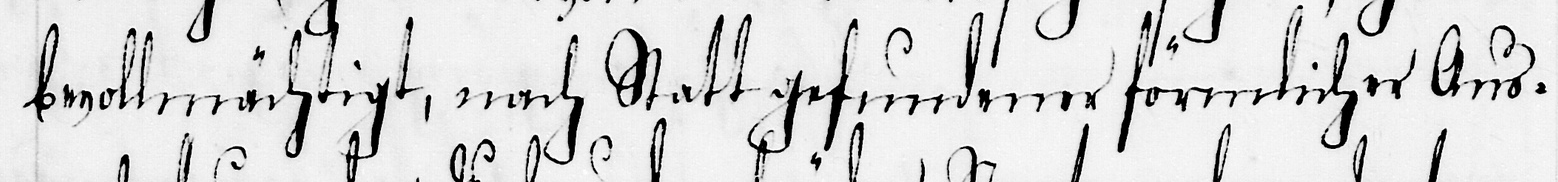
bevollmächtigt, nach Statt gefundener förmlicher Aus¬
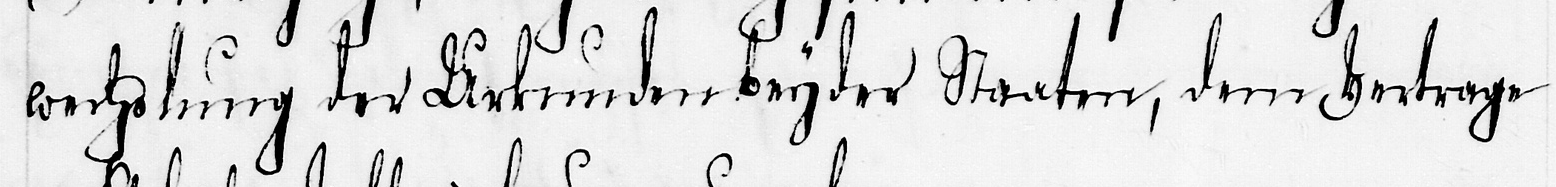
wechslung der Urkunden beyder Staaten, dem Vertrage
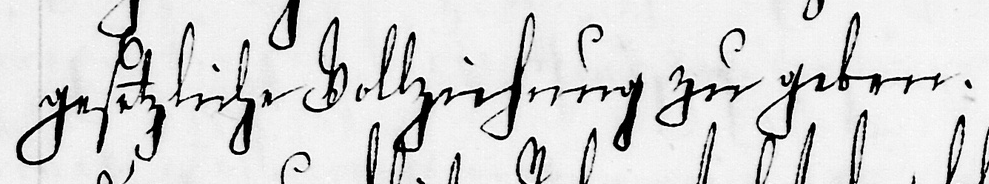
gesetzliche Vollziehung zu geben.
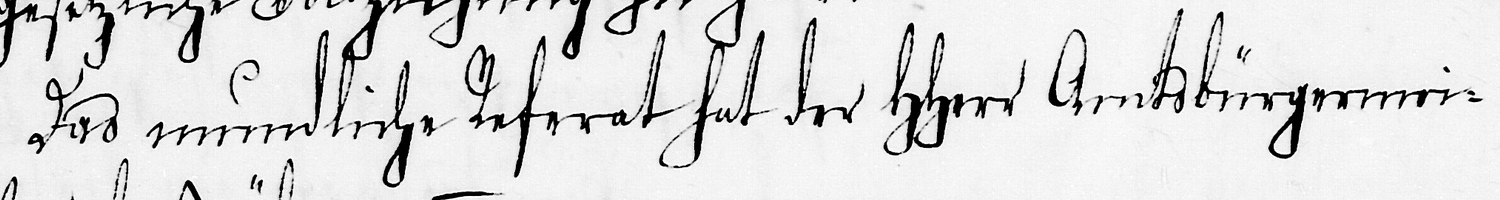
Das mundliche Referat hat der HHerr Amtsbürgermei¬
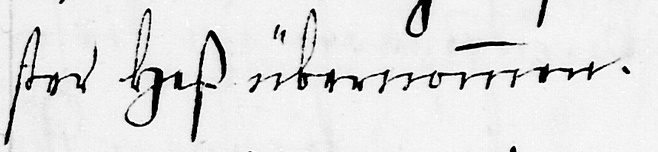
ster Heß übernommen.
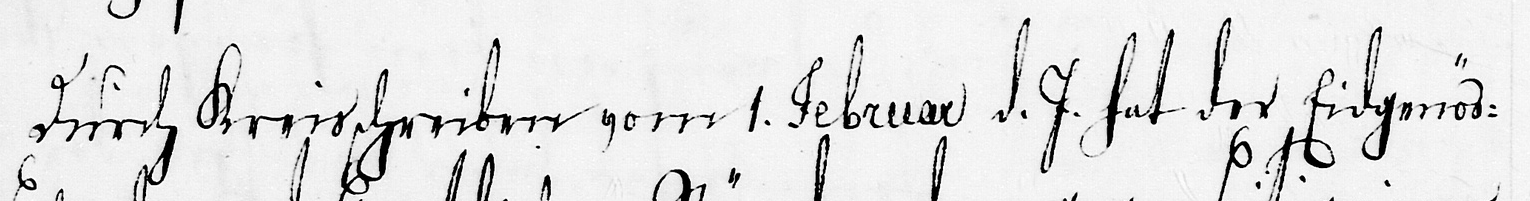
Durch Kreisschreiben vom 1. Februar d. J. hat der Eidgenöß¬
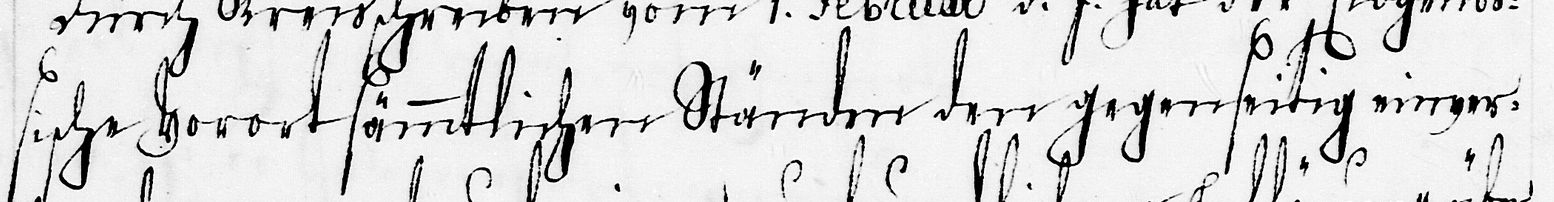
ische Vorort sämmtlichen Ständen den gegenseitig einver¬
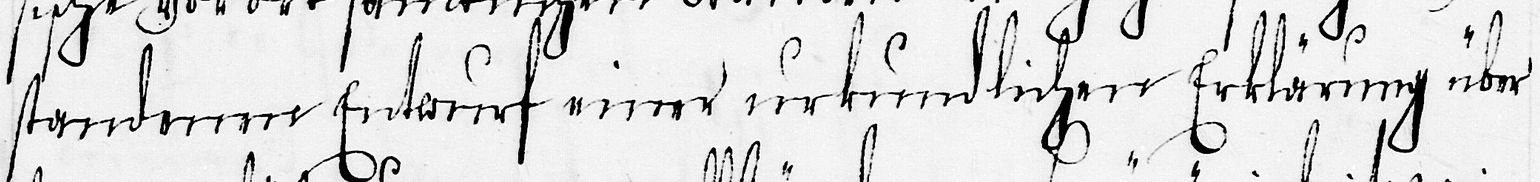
standenen Entwurf einer urkundlichen Erklärung über
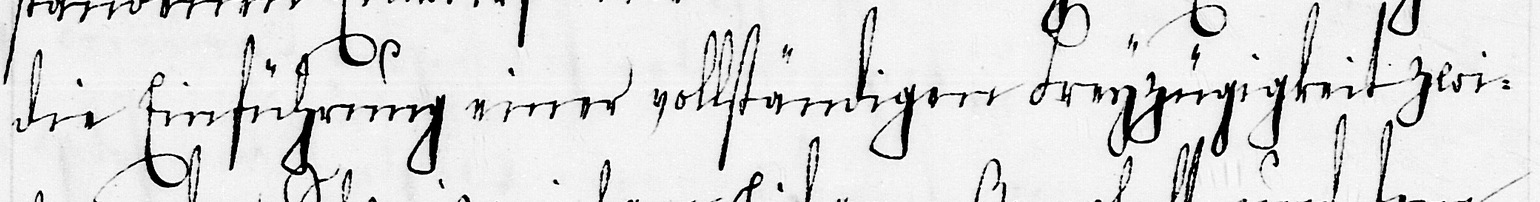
die Einführung einer vollständigen Freyzügigkeit zwi¬
